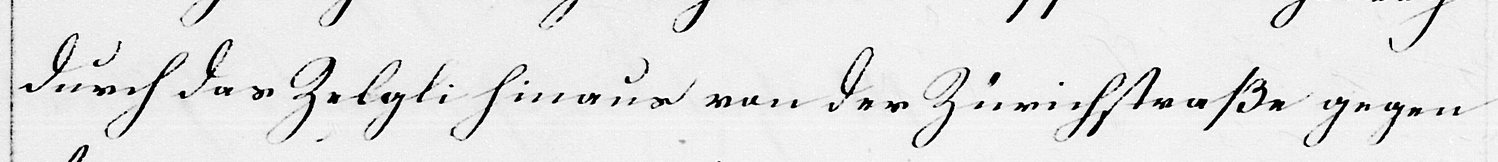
durch das Zelgli hinaus von der Zürichstraße gegen
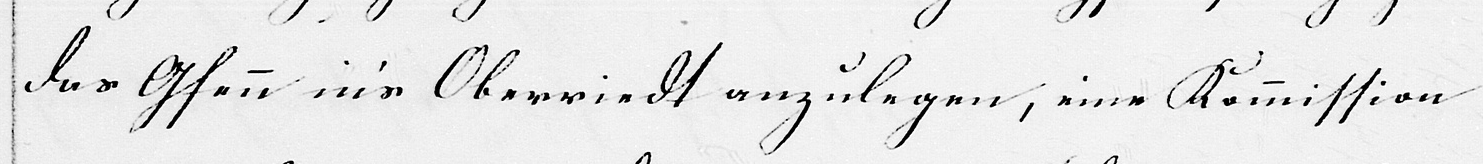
das Gfenn in’s Oberriedt anzulegen, eine Kommission
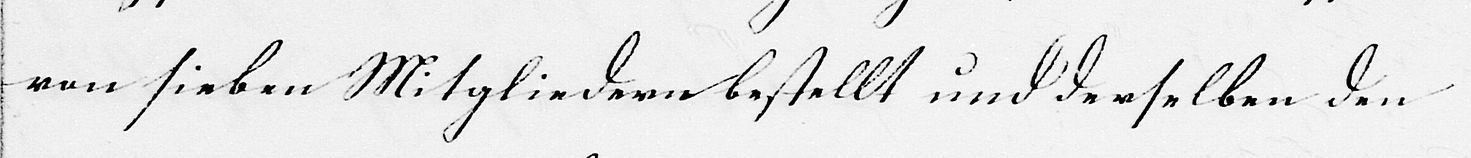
von sieben Mitgliedern bestellt und derselben den
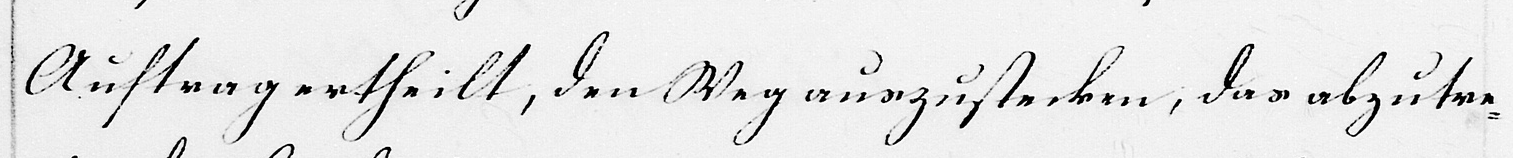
Auftrag ertheilt, den Weg auszustecken, das abzutre¬
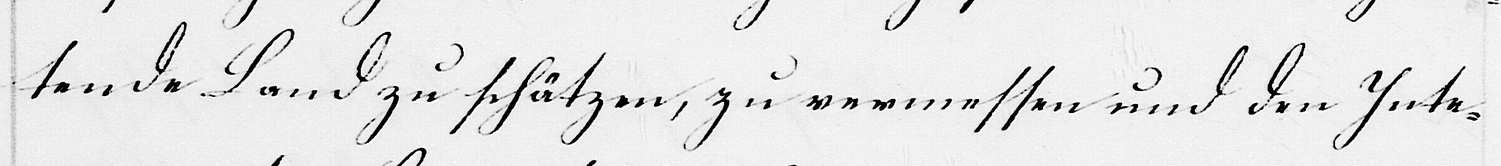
tende Land zu schätzen, zu vermessen und den Inte¬
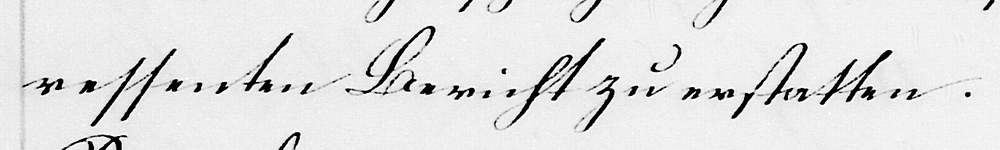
ressenten Bericht zu erstatten.
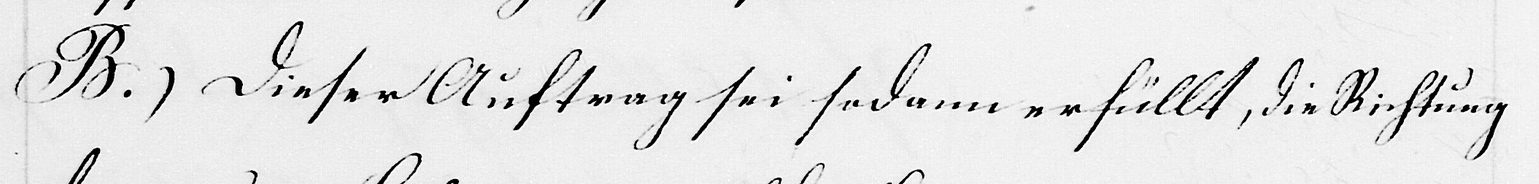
B.) Dieser Auftrag sei sodann erfüllt, die Richtung
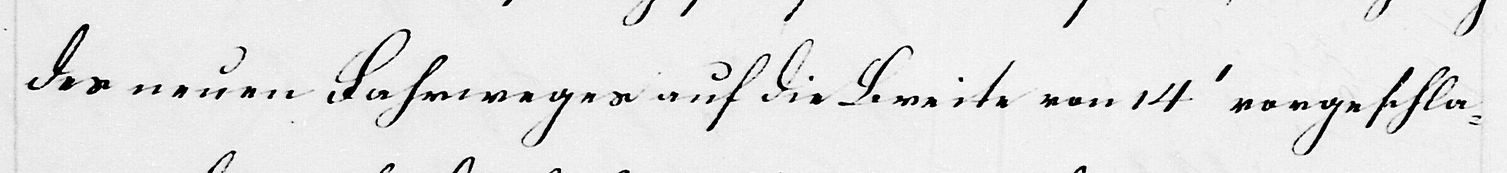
des neuen Fahrweges auf die Breite von 14 [Fuss] vorgeschla¬
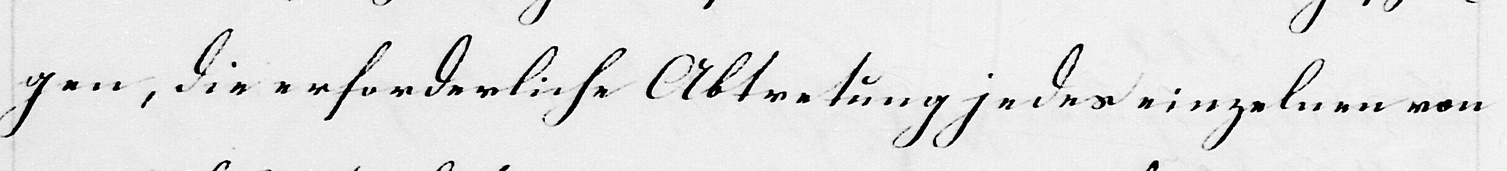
gen, die erforderliche Abtretung jedes einzelnen von
